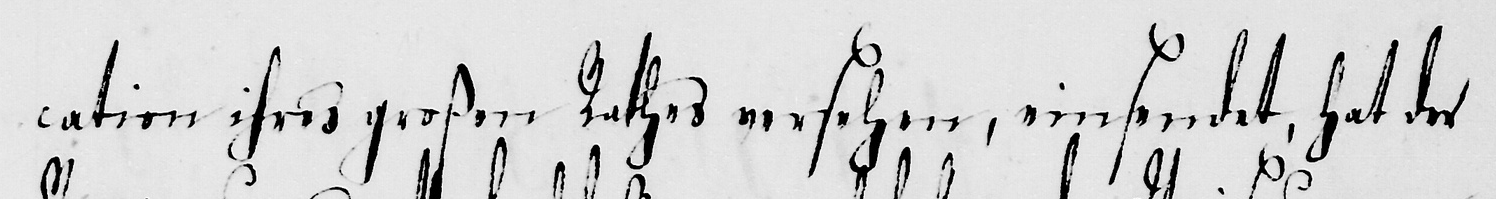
cation ihres Großen Rathes versehen, einsendet, hat der
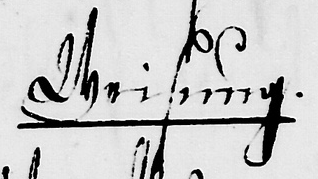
Weisung.
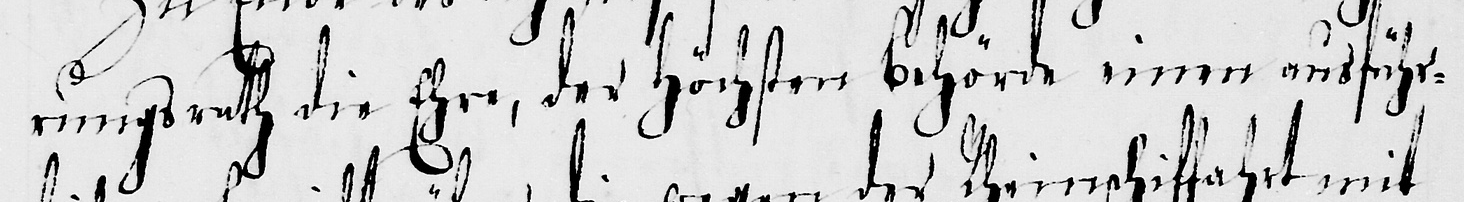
rungsrath die Ehre, der Höchsten Behörde einen ausführ¬
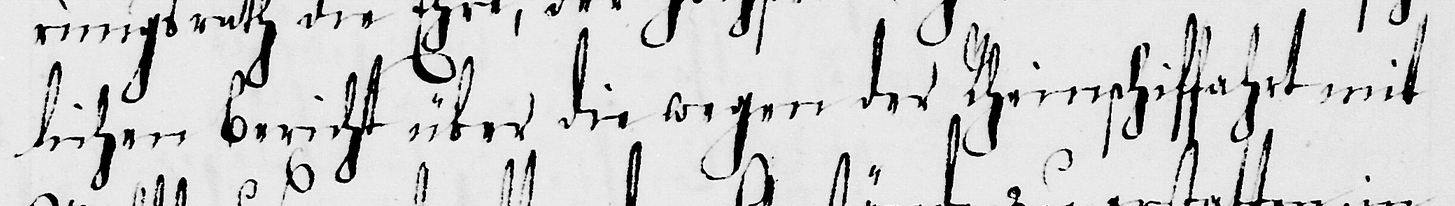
lichen Bericht über die wegen der Rheinschiffahrt mit
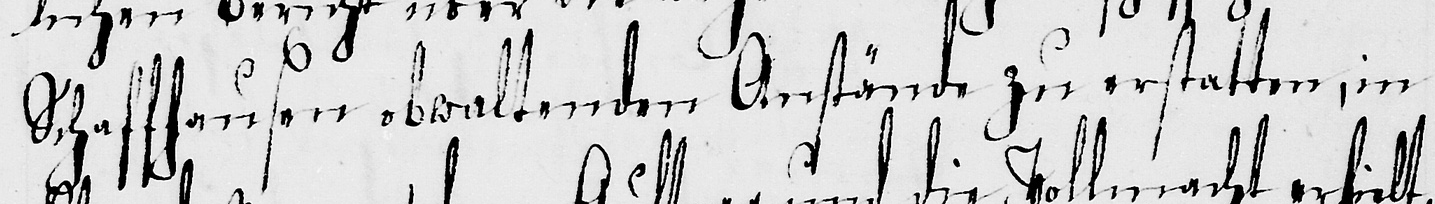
Schaffhausen obwaltenden Anstände zu erstatten, in
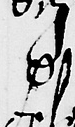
s¬
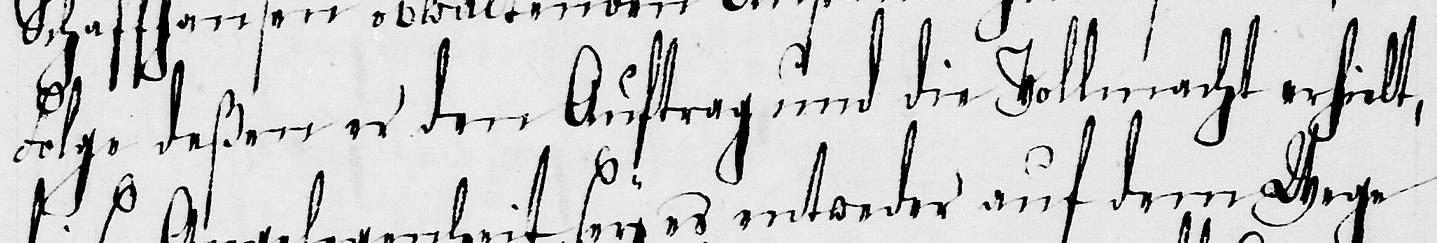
olge deßen er den Auftrag und die Vollmacht erhiel¬
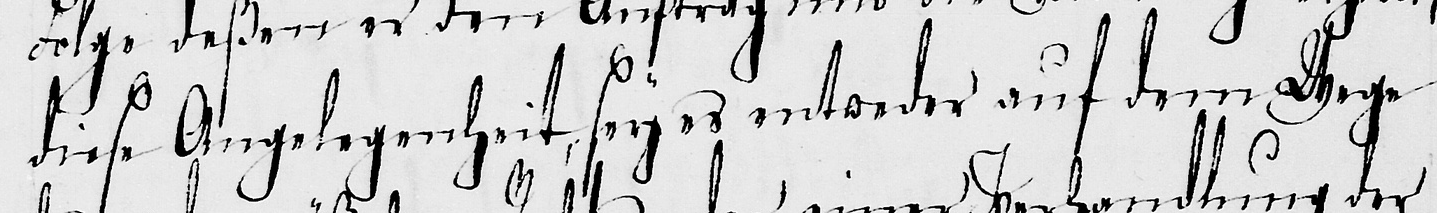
diese Angelegenheit, sey es entweder auf dem Wege
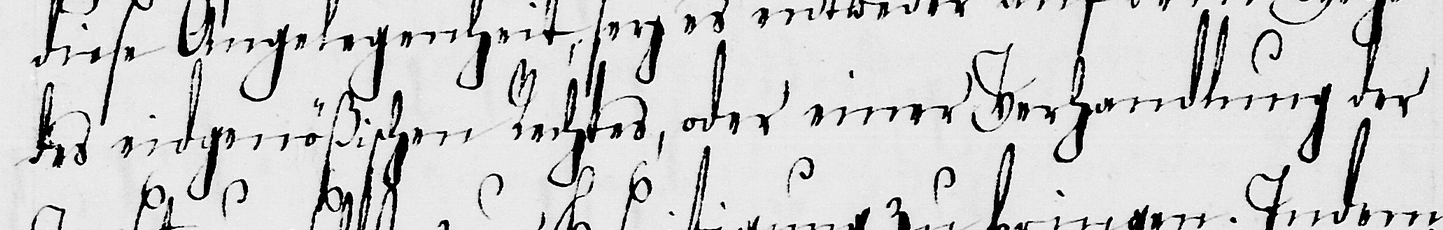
des eidgenößischen Rechtes, oder einer Verhandlung der
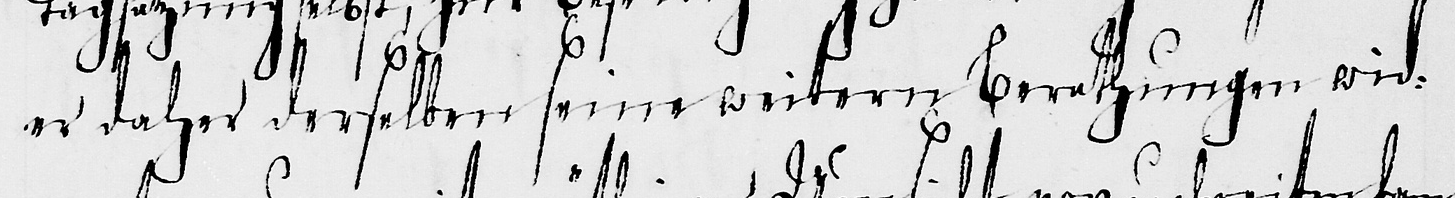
er daher derselben seine weitern Berathungen wid¬
